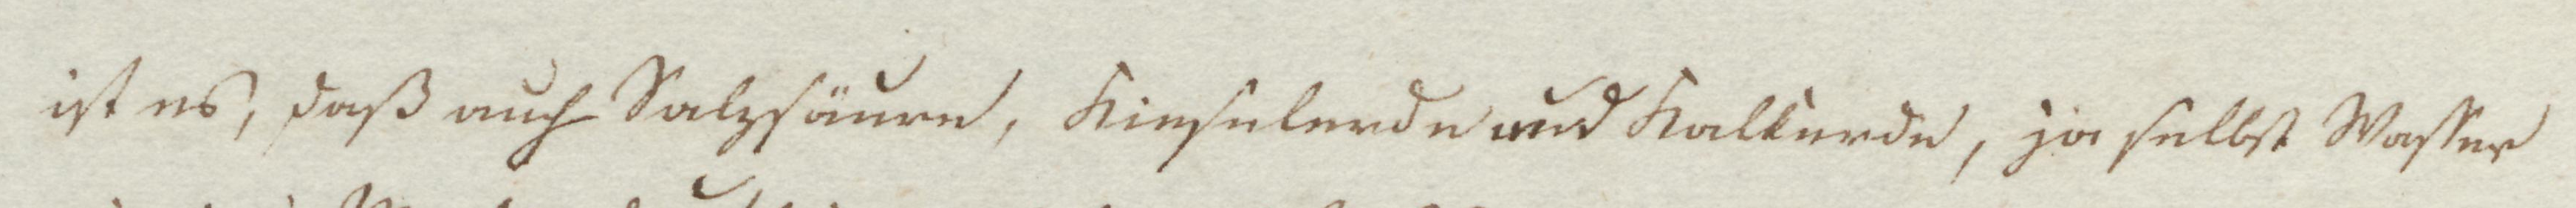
ist es, daß auch Salzsäure, Kieselerde u.und Kalkerde, ja selbst Wasser
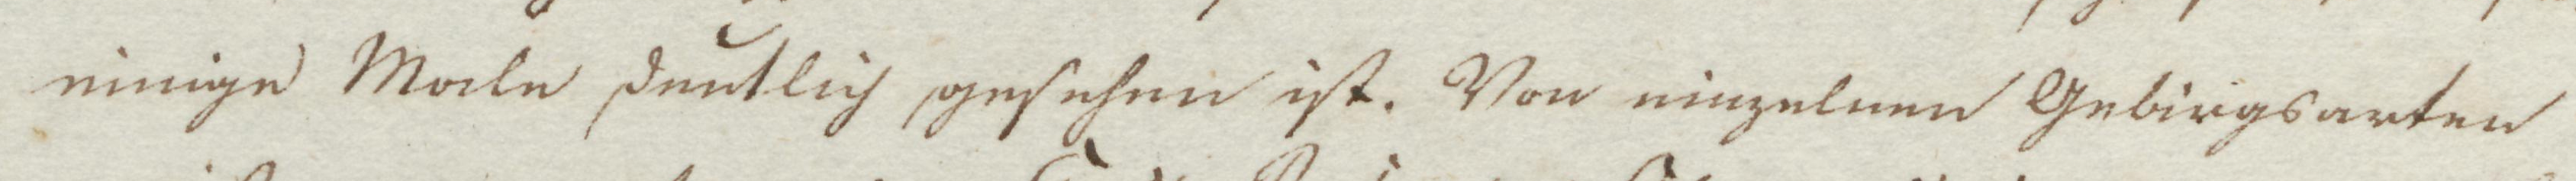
einige Male deutlich gesehen ist. Von einzelnen Gebirgsarten
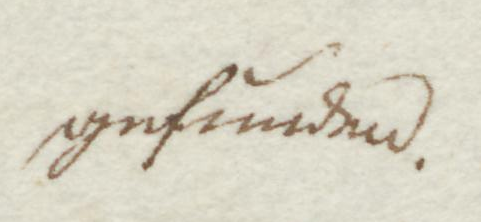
gefunden.
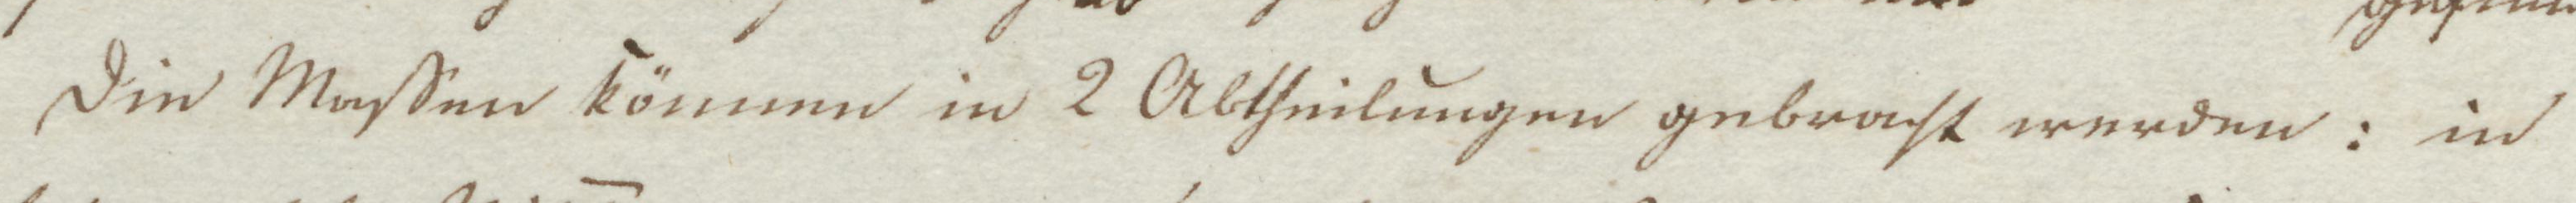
Die Massen können in 2 Abtheilungen gebracht werden: in
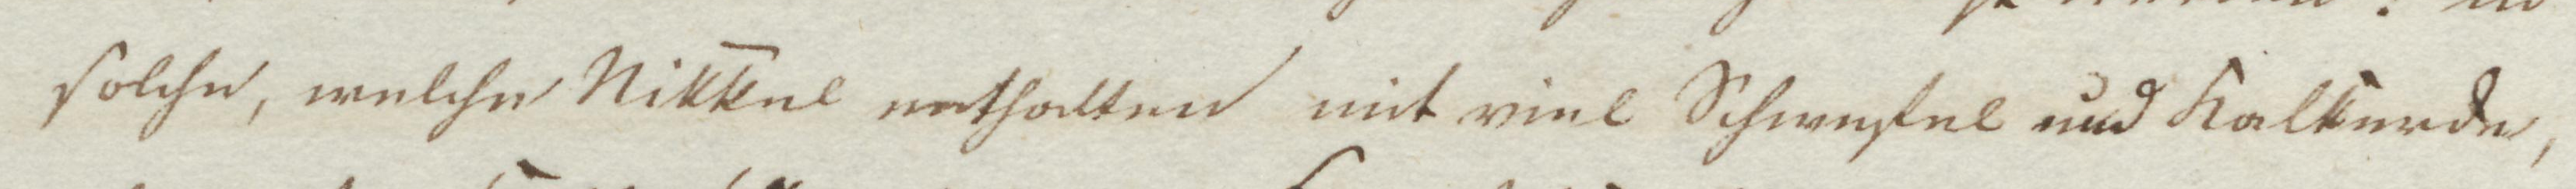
solche welche Nikkel enthalten mit viel Schwefel u.und Kalkerde,
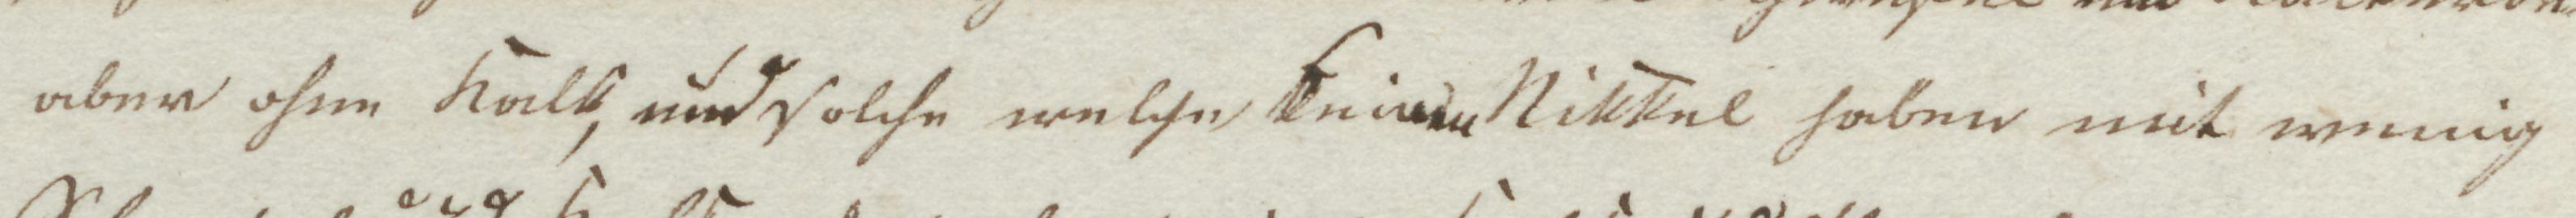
aber ohne Kalk, u.und solche welche keinnen Nikkel haben mit wenig
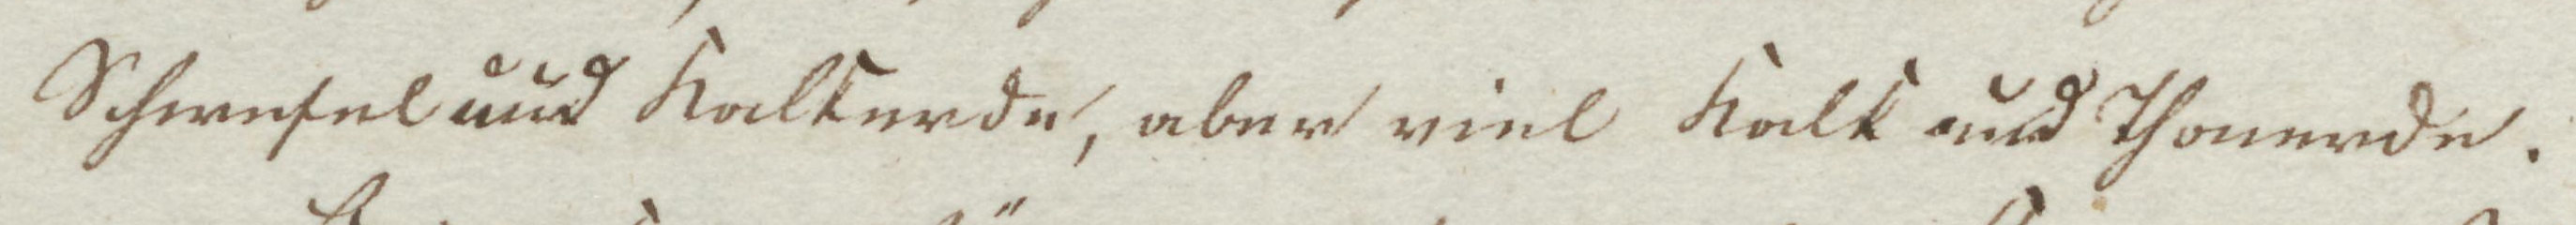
Schwefel u.und Kalkerde, aber viel Kalk u.und Thonerde.
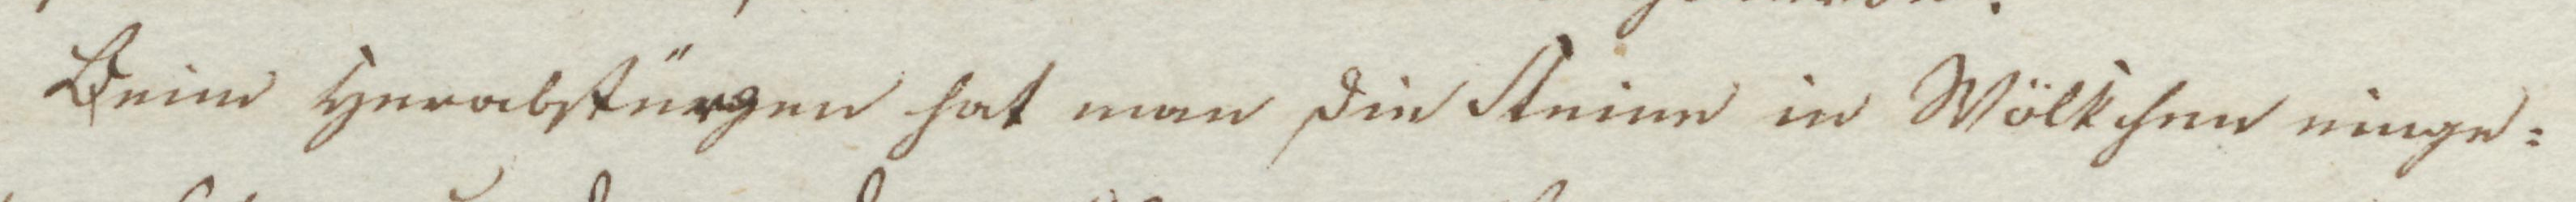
Beim Herabstürzen hat man die Steine in Wölkchen einge-
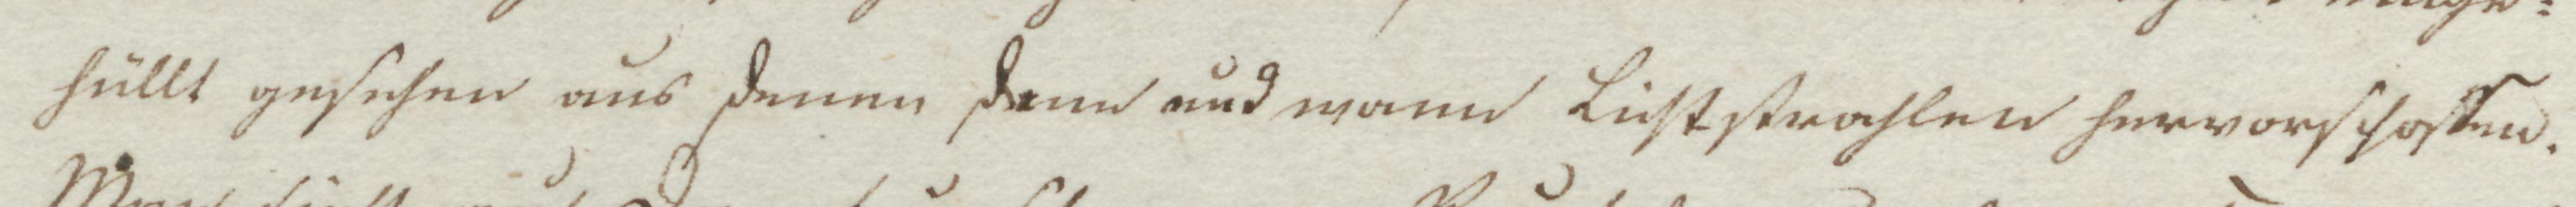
hüllt gesehen aus denen deann u.und wann Lichtstrahlen hervorschoßssen.
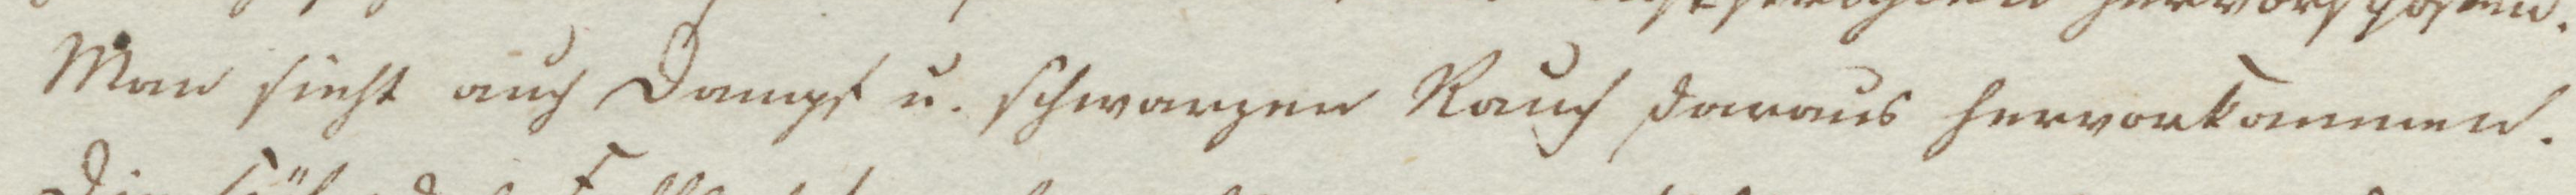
Man sieht auch Dampf u. schwarzen Rauch daraus hervorkommen.
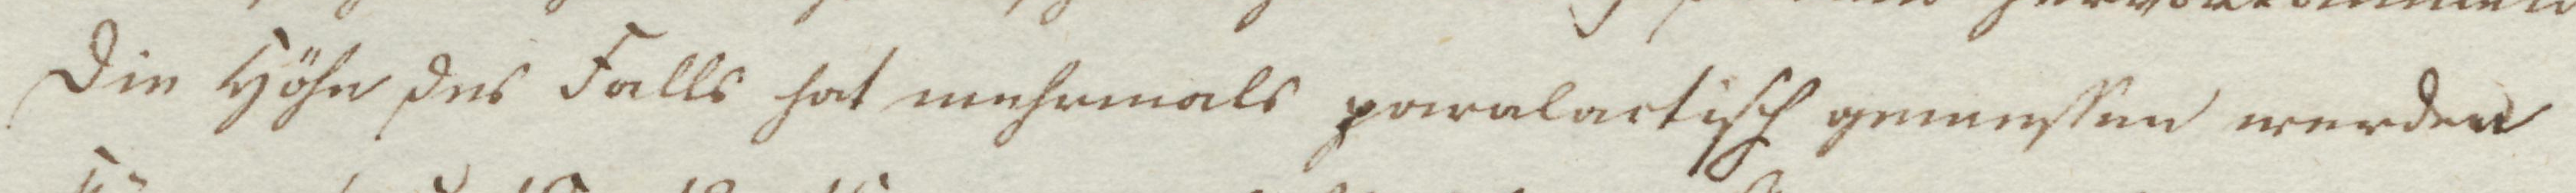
Die Höhe des Falls hat mehrmals paralactisch gemessen werden
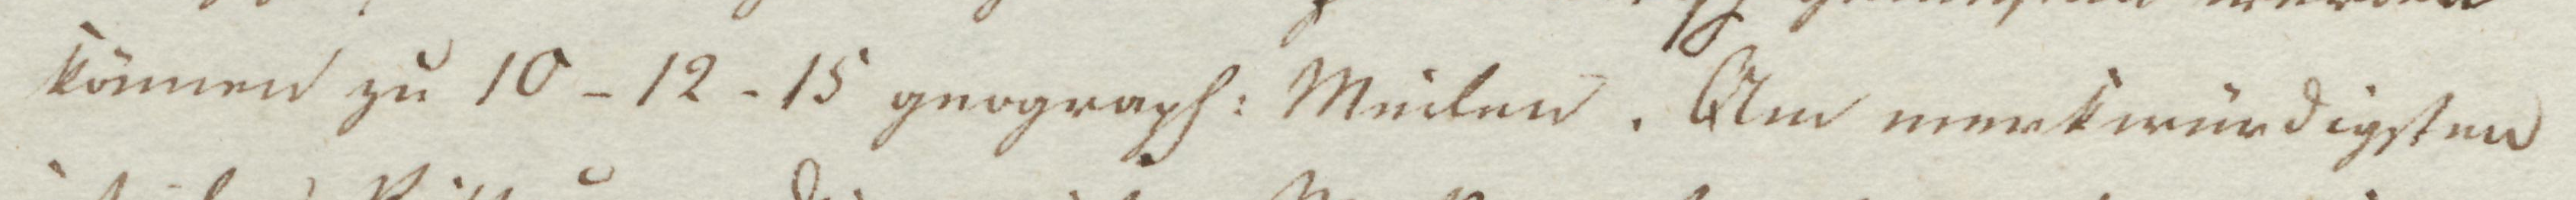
können zu 10–12–15 geograph. Meilen. Am merkwürdigsten
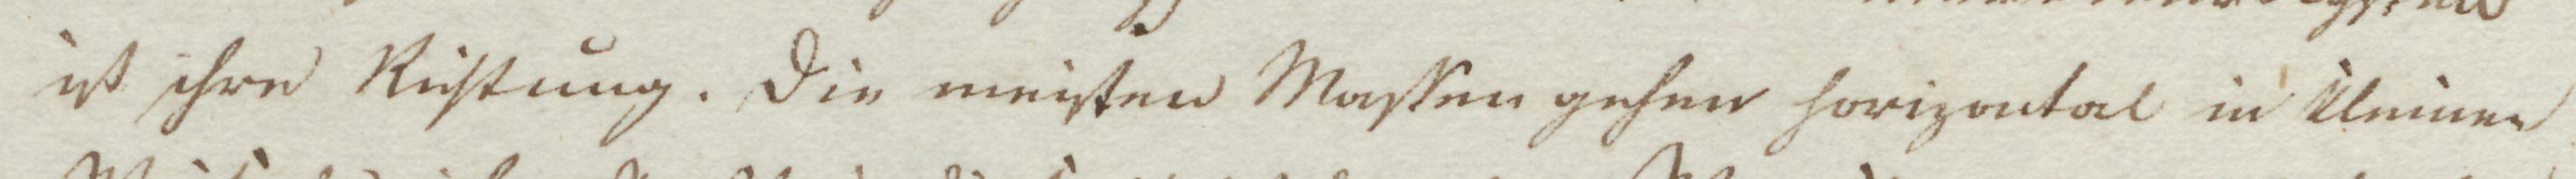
ist ihre Richtung. Die meisten Massen gehen horizontal in kleinen
